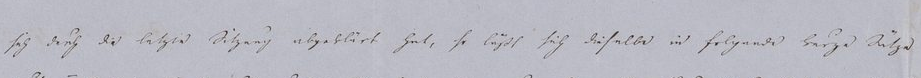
sich durch die letzte Sitzung abgeklärt hat, so läßt sich dieselbe in folgende kurze Sätze
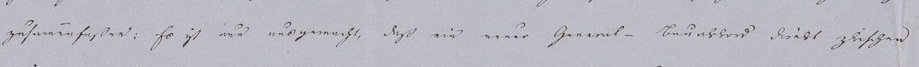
zusammenfassen: Es ist nun ausgemacht, daß ein neuer General-Bauakkord direkt zwischen
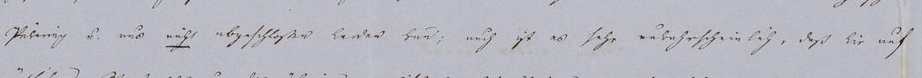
Pickering u. uns nicht abgeschloßen werden kann; auch ist es sehr unwahrscheinlich, daß wir auf
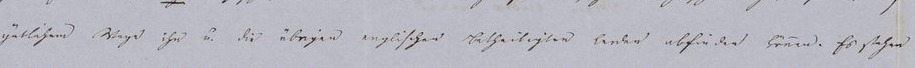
gütlichem Wege ihn u. die übrigen englischen Betheiligten werden abfinden können. Es stehen
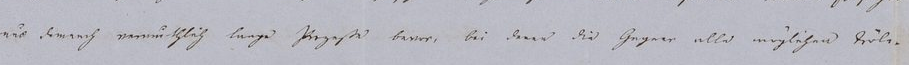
uns demnach vermuthlich lange Prozeße bevor, bei denen die Gegner alle möglichen Tröle-
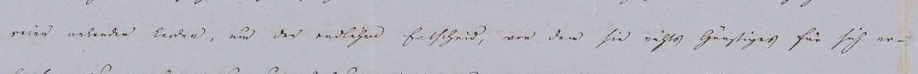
reien anwenden werden, um den endlichen Entscheid, von dem sie nichts Günstiges für sich er-
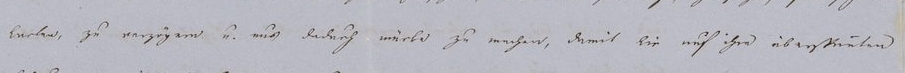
warten, zu verzögern u. uns dadurch mürbe zu machen, damit wir auf ihre überspannten
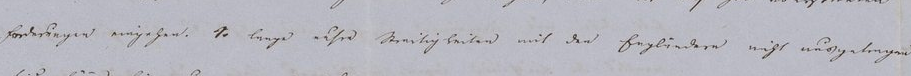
Forderungen eingehen. So lange unsre Streitigkeiten mit den Engländern nicht ausgetragen
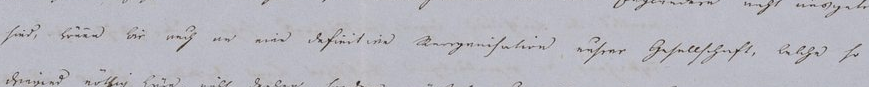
sind, können wir auch an eine definitive Reorganisation unsrer Gesellschaft, welche so
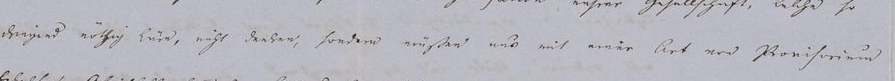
dringend nöthig wäre, nicht denken, sondern müßen uns mit einer Art von Provisorium
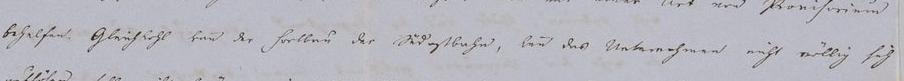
behelfen. Gleichwohl kann der Fortbau der Südostbahn, wenn das Unternehmen nicht völlig sich
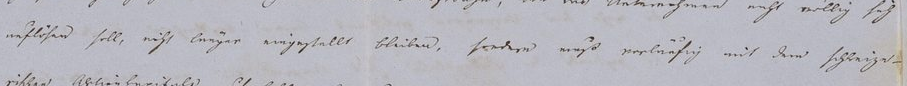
auflösen soll, nicht länger eingestellt bleiben, sondern muß vorläufig mit dem schweize-
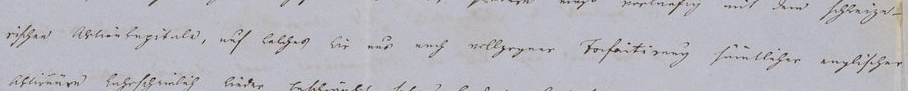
rischen Aktienkapitale, auf welches wir uns nach vollzogner Forfaitirung sämmtlicher englischer
